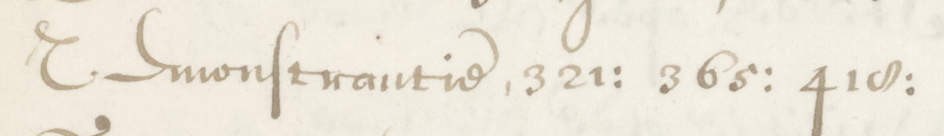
Remonstrantie, 321: 365: 418:
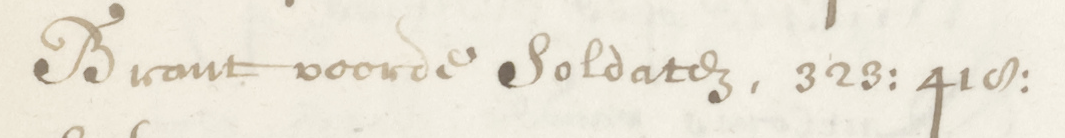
Brant voorde Soldaten, 323: 418:
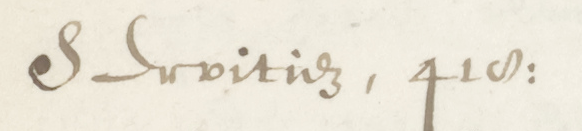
Servitien, 418:
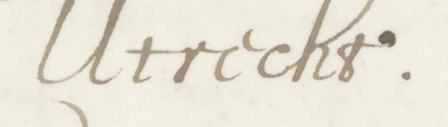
Utrecht.
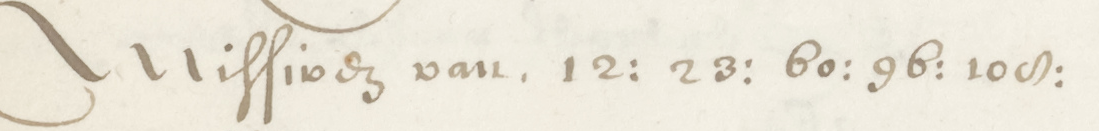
Missiven van, 12: 23: 60: 96: 108:
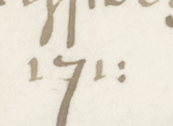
171:
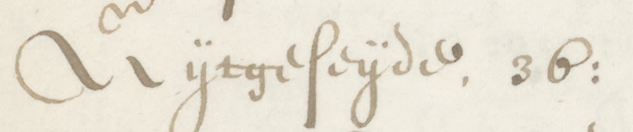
Uijtgeseijde, 36:
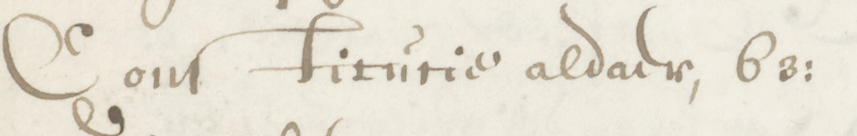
Constitutie aldaer, 63:
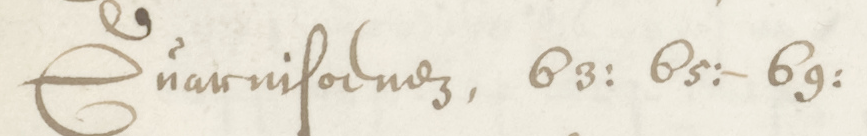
Guarnisoenen, 63: 65: 69:
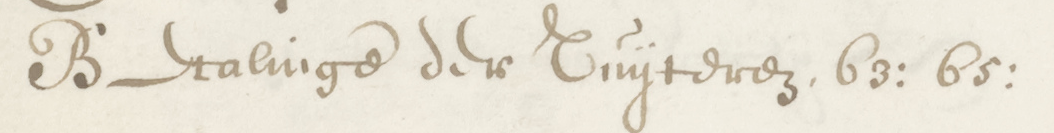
Betalinge der Ruijteren, 63: 65:
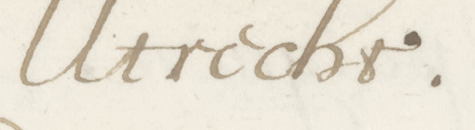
Utrecht.
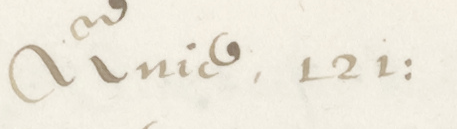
Unie, 121:
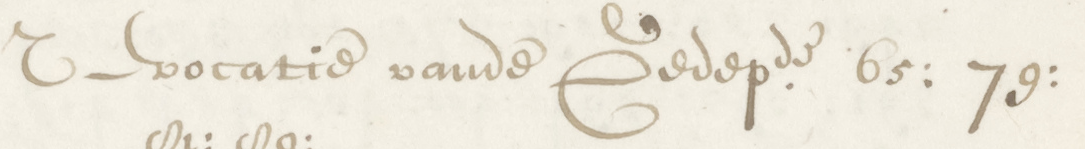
Revocatie vande Gedepde. 65: 79:
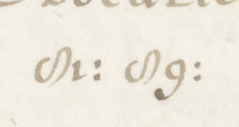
81: 89:
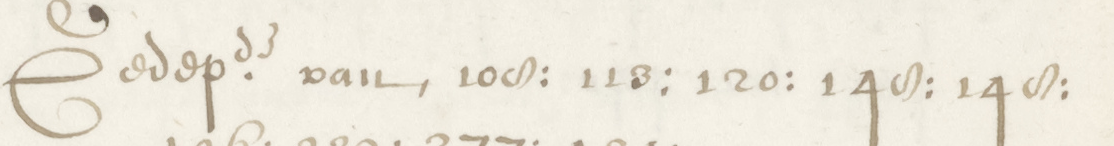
Gedepde. van, 108: 113, 120: 148: 148:
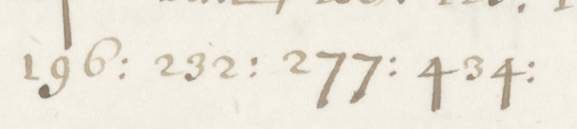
196: 232: 277: 434:
